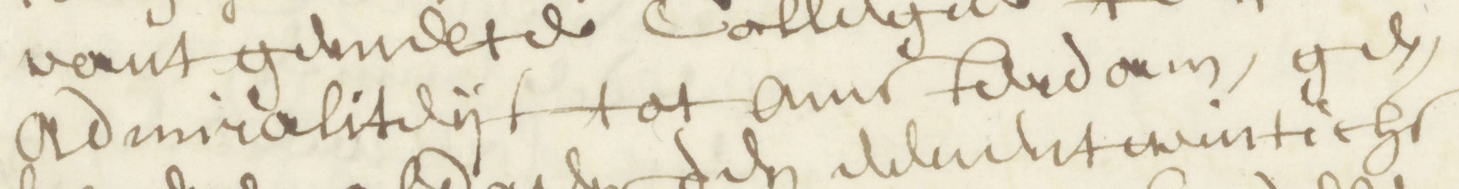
Admiraliteijt tot Amsterdam, ge„
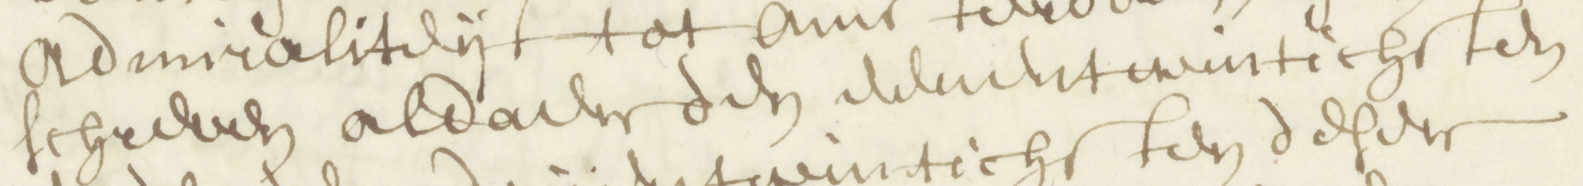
schreven aldaer den eenentwintichsten
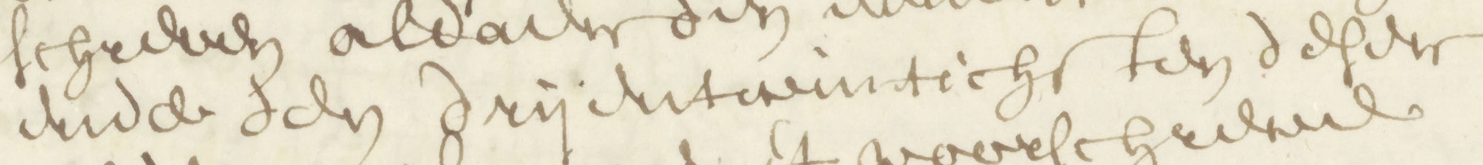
ende den drijentwintichsten deser
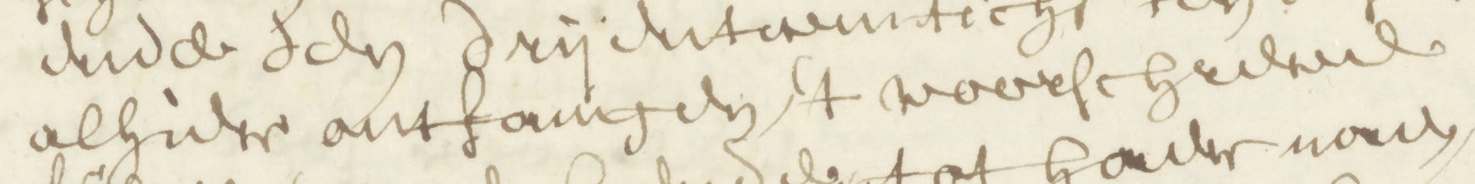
alhier ontfangen, 't voorschreve
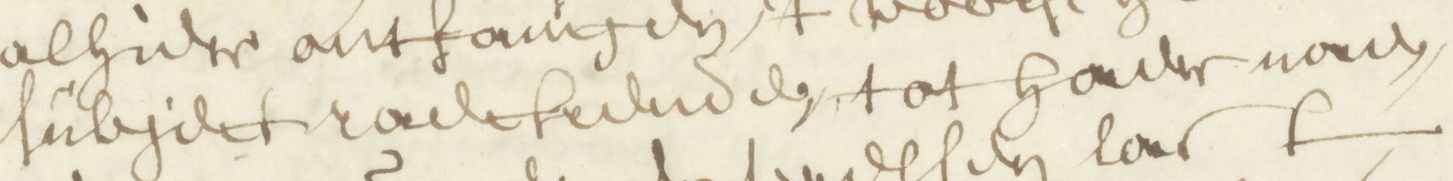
subject raeckende, tot haer nae„
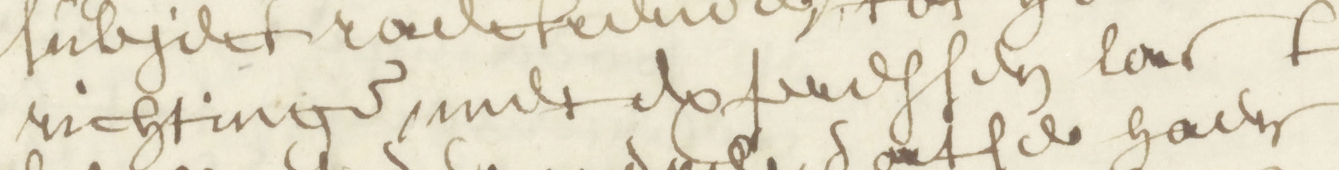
richtinge, met expressen last„
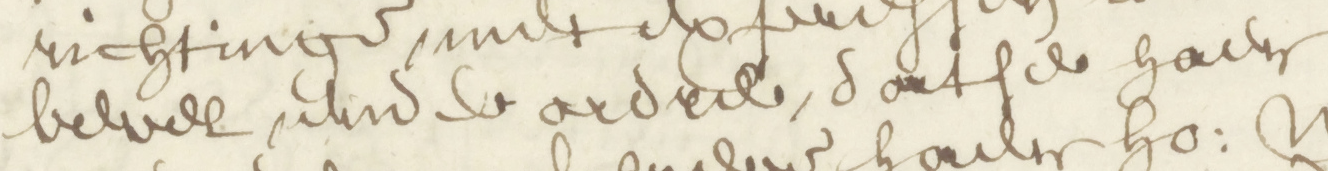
bevel, ende ordre, datse haer
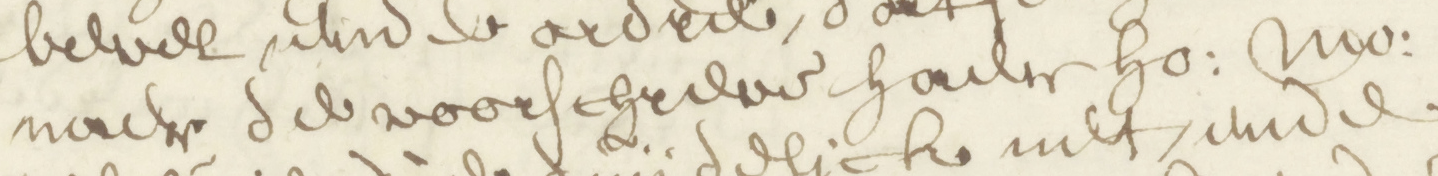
naer de voorschreve haer Ho:Mo:
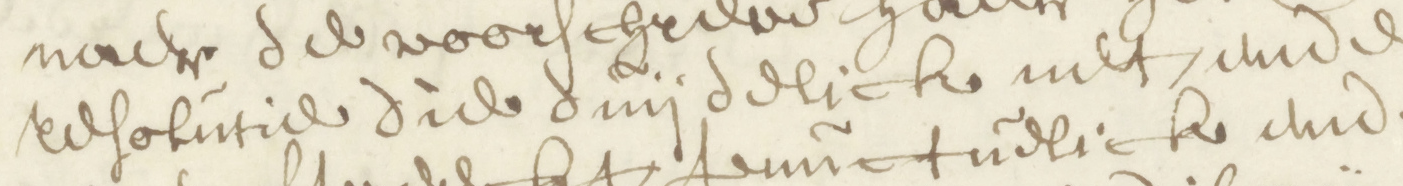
resolutie die duijdelick net, ende
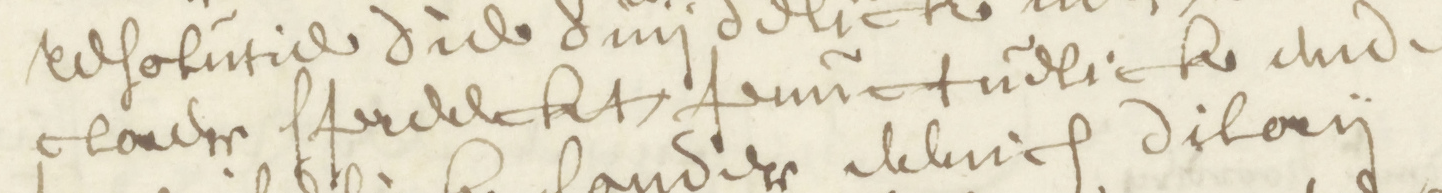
claer spreeckt, punctuelick ende
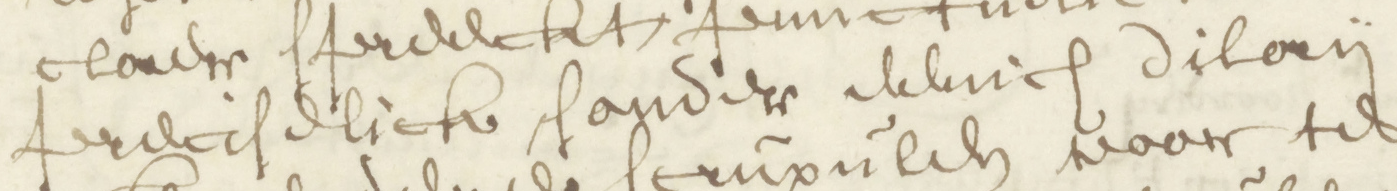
preciselick, sonder eenich dilaij
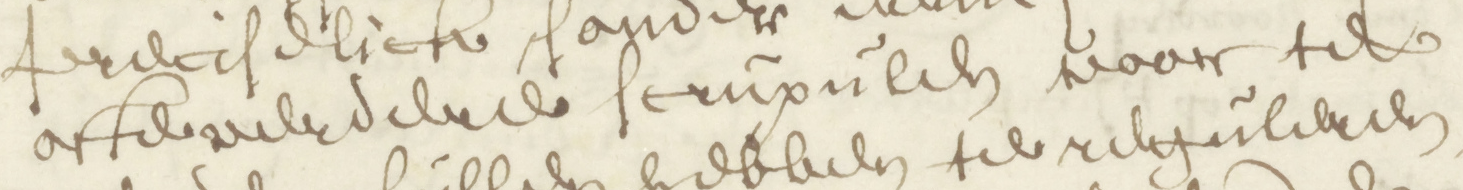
ofte verdere scrupulen voor te
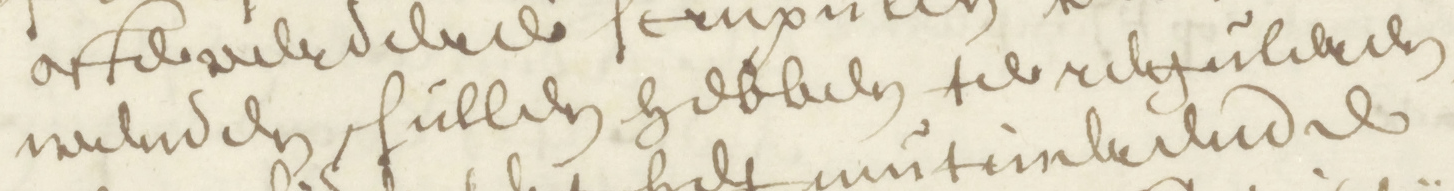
wenden, sullen hebben te reguleren
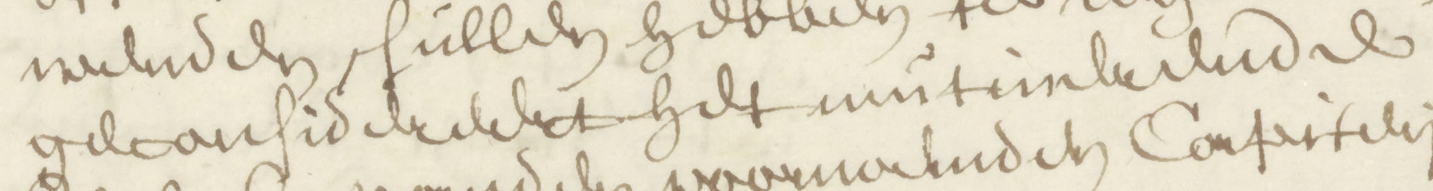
geconsidereert het mutinerende
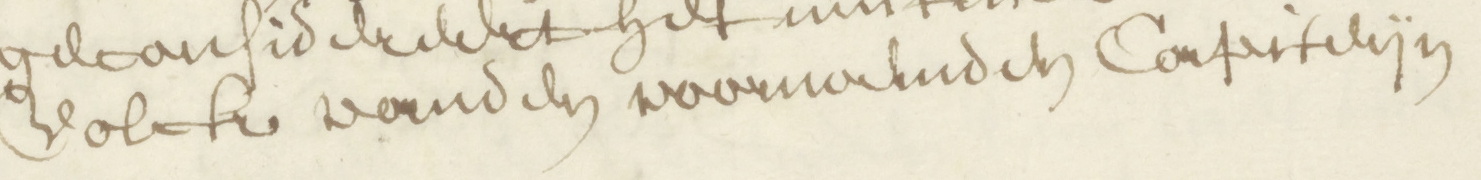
Volck vanden voornoemden Capiteijn
